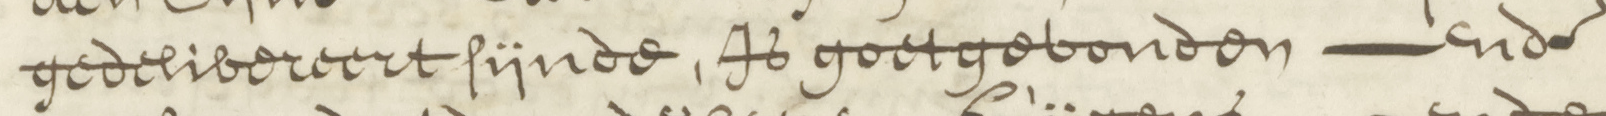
gedelibereert sijnde, Is goetgevonden ende
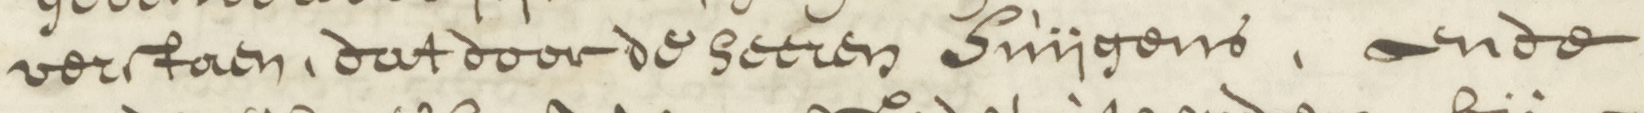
verstaen, dat door de heeren Huijgens, ende
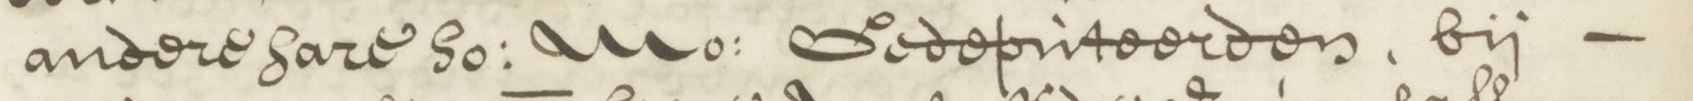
andere hare ho:Mo: Gedeputeerden, bij —
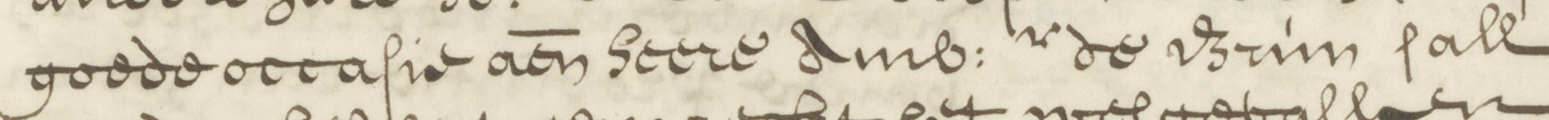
goede occasie aen heere Amb:r de Brun sall
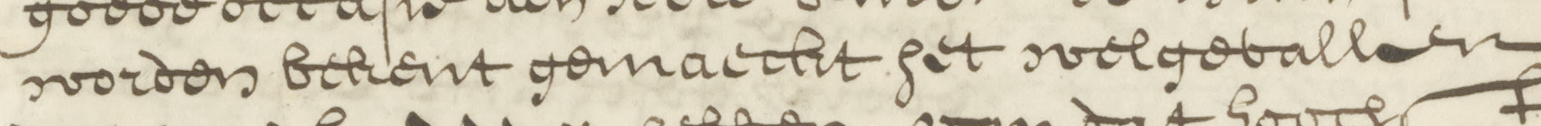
worden bekent gemaeckt het welgevallen
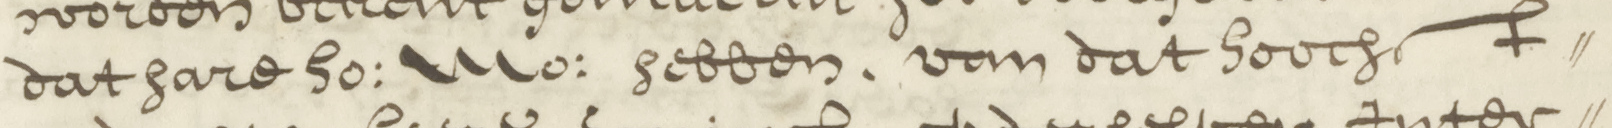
dat hare ho:Mo: hebben, van dat hoochst,,
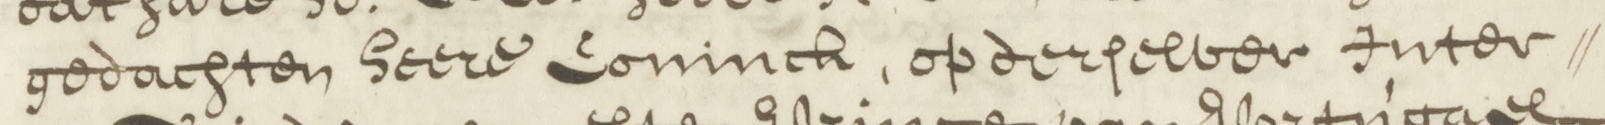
gedachten heere Coninck, op derselver Inter,,
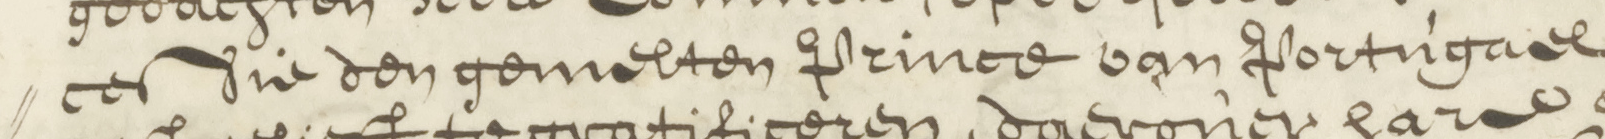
,,cessie den gemelten Prince van Portugael
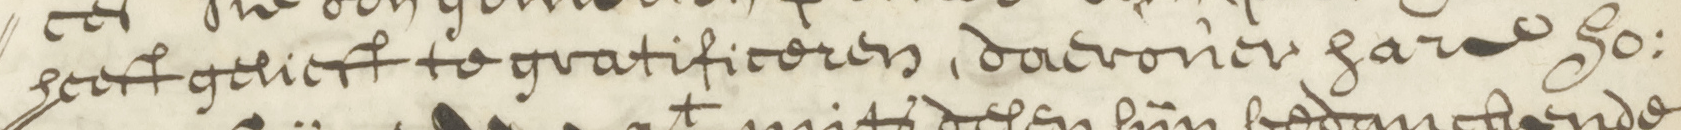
heeft gelieft te gratificeren, daerouer hare Ho:
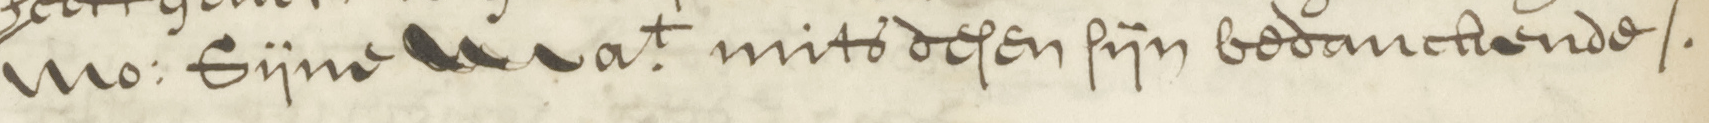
Mo: Sijne Mat. mitsdesen sijn bedanckende
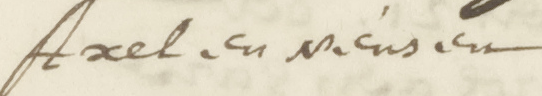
Axel en Neusen
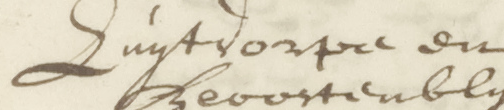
Zuytdorpe en
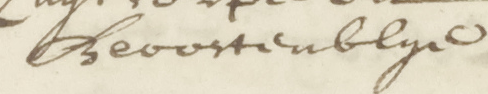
Beoostenblye
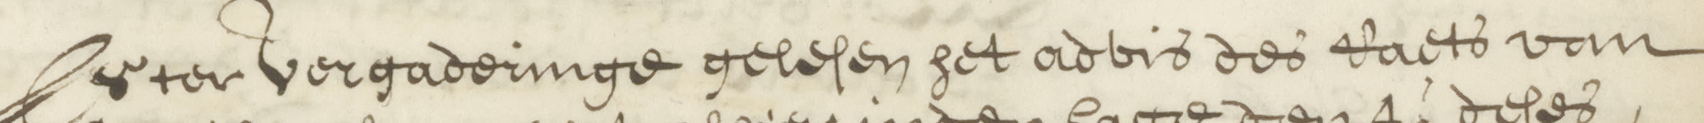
Is ter Vergaderinge gelesen het advis des Raets van
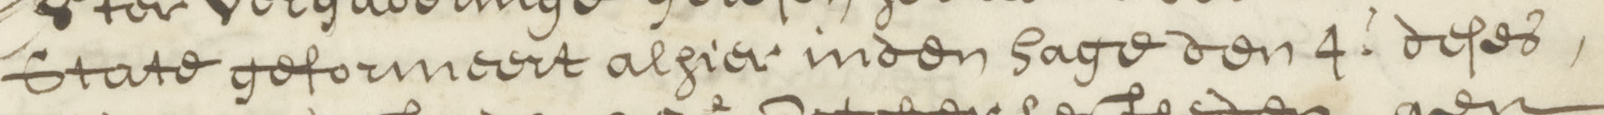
State geformeert alhier inden hage den 4e. deses,
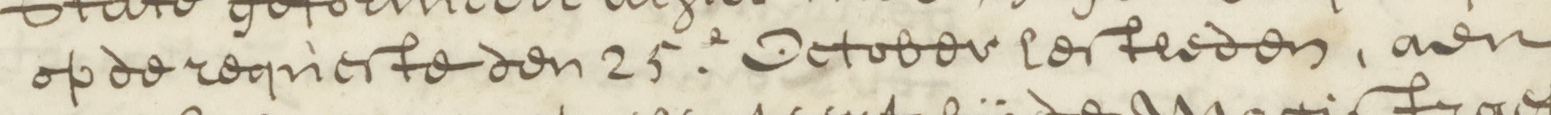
op de requeste den 25e. October lestleden, aen
